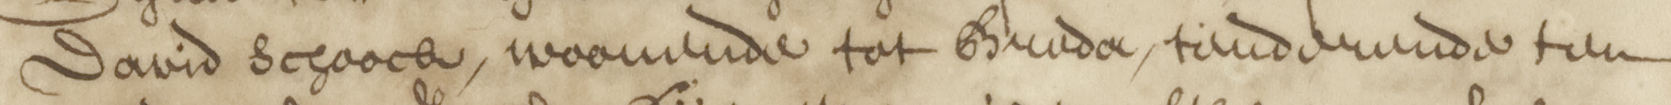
David Schoock, woonende tot Breda, tenderende ten
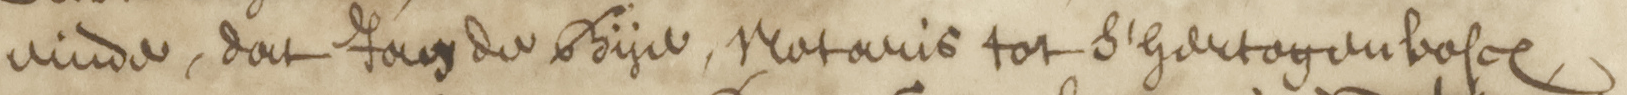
einde, dat Jan de Bije, Notaris tot s'hertogenbosch,
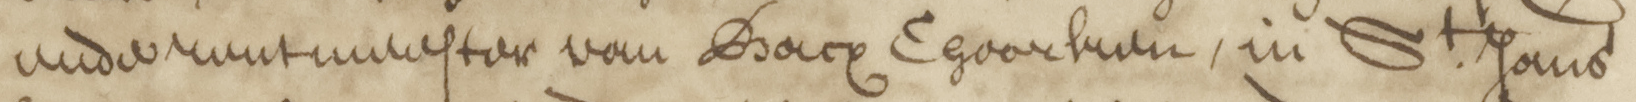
ende rentmeester van Bacx Choorken, in St. Jans
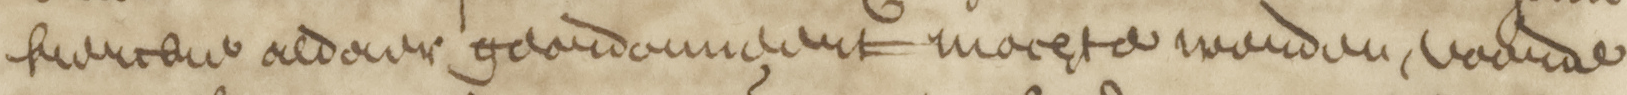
kercke aldaer geordonneert mochte werden, voorde
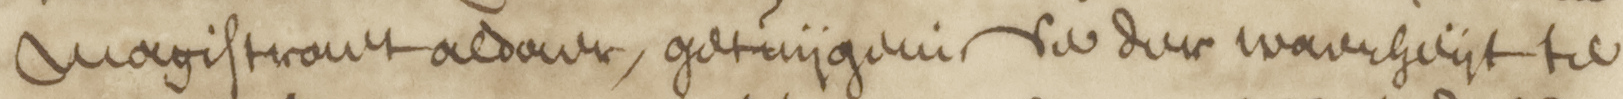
Magistraet aldaer, getuijgenisse der waerheijt te
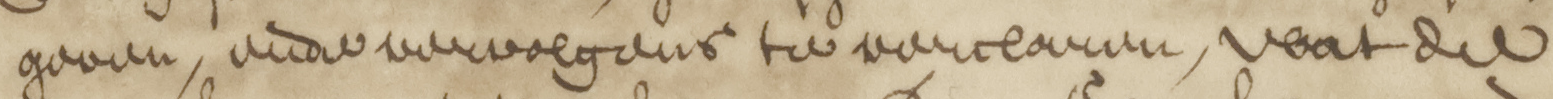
geven, ende vervolgens te verclaren, wat de
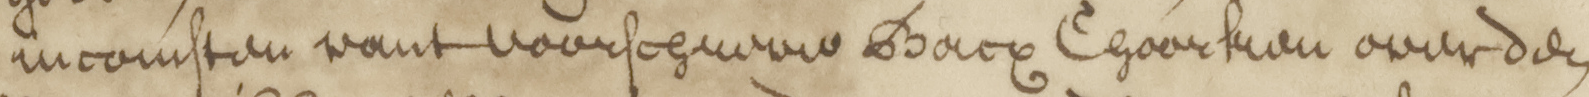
incomsten vant voorschreve Bacx Choorken over den
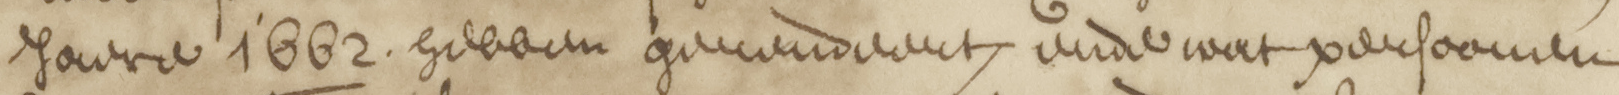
Jaere 1662. hebben gerendeert, ende wat persoonen
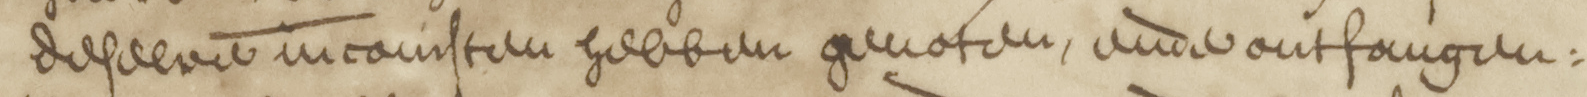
deselve incomsten hebben genoten, ende ontfangen:
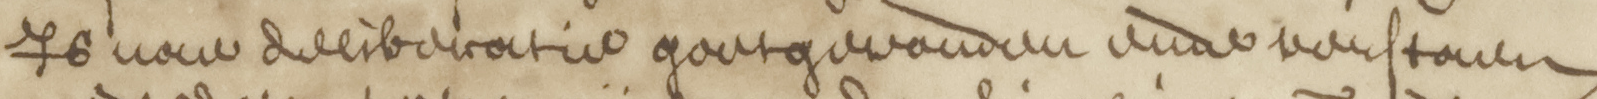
Is nae deliberatie goetgevonden ende verstaen,
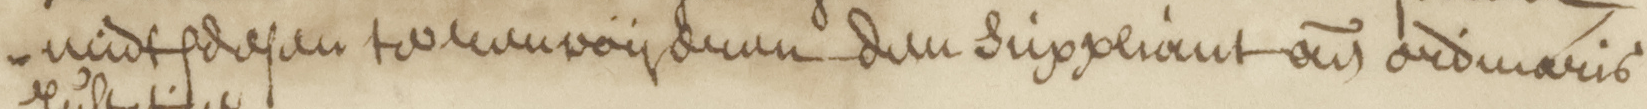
midtsdesen te renvoijeren den Suppliant aen ordinaris
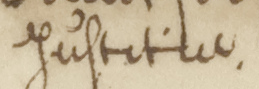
Justitie.
